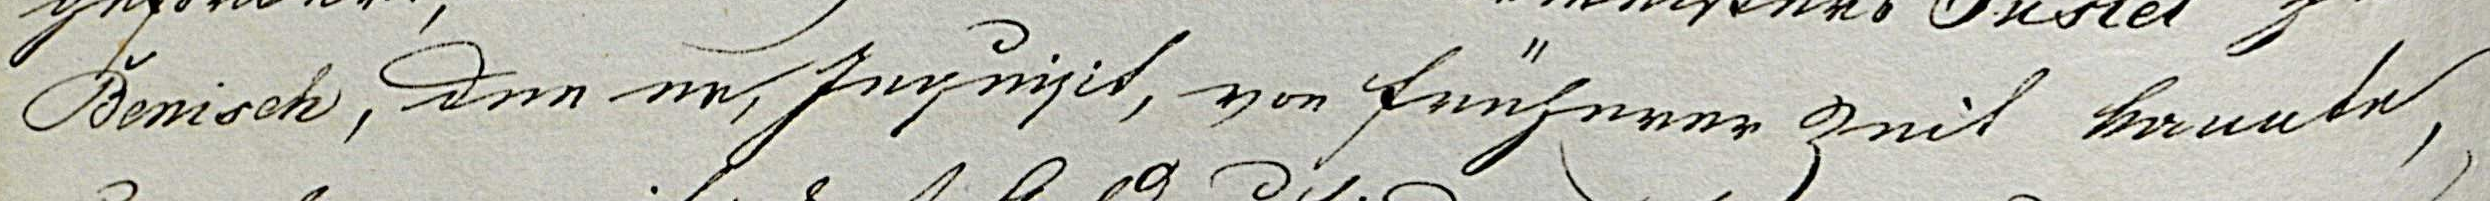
Benisek, den er, Inquisit, von früherer Zeit kannte,
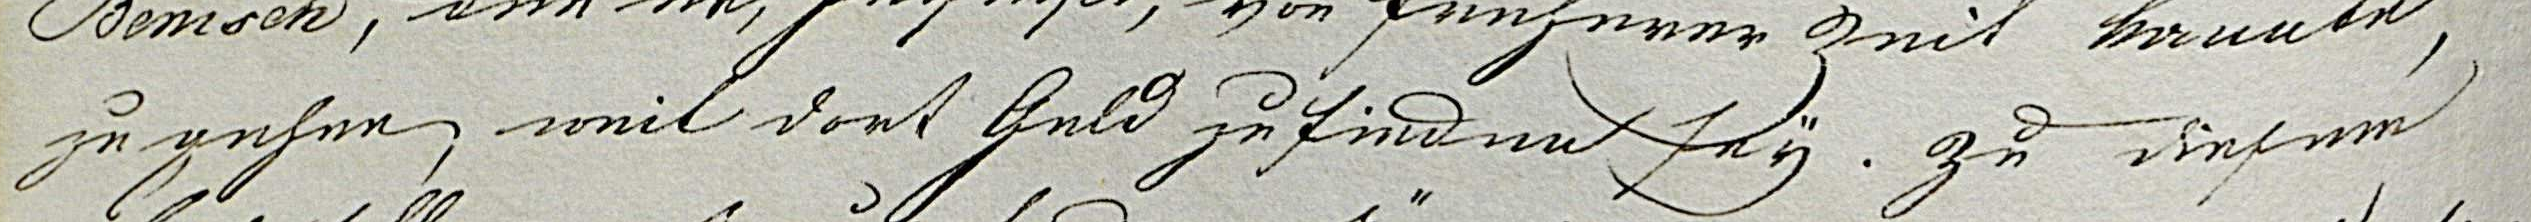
zu gehen, weil dort Geld zu finden sey. Zu diesem
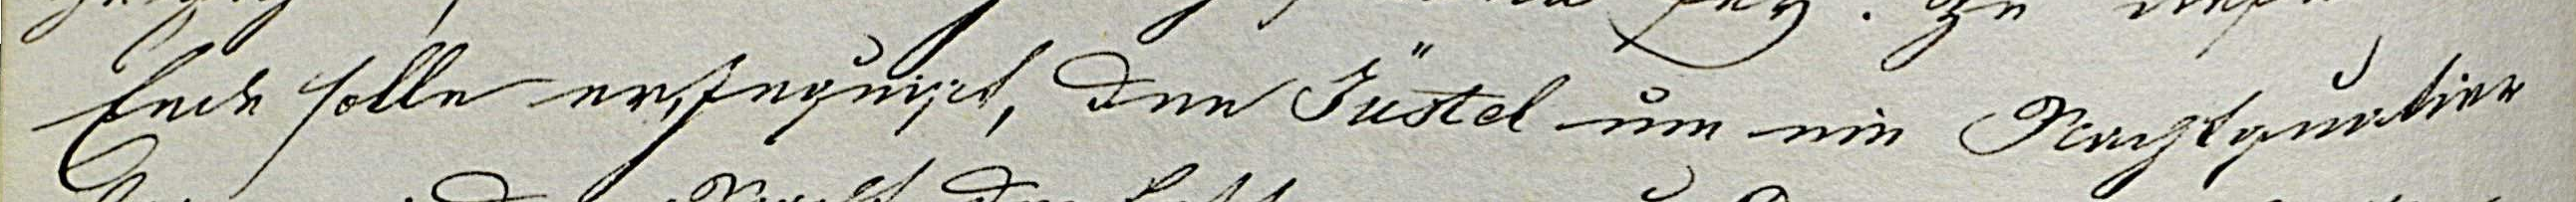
Ende solle er, Inquisit, den Jüstel um ein Nachtquartier
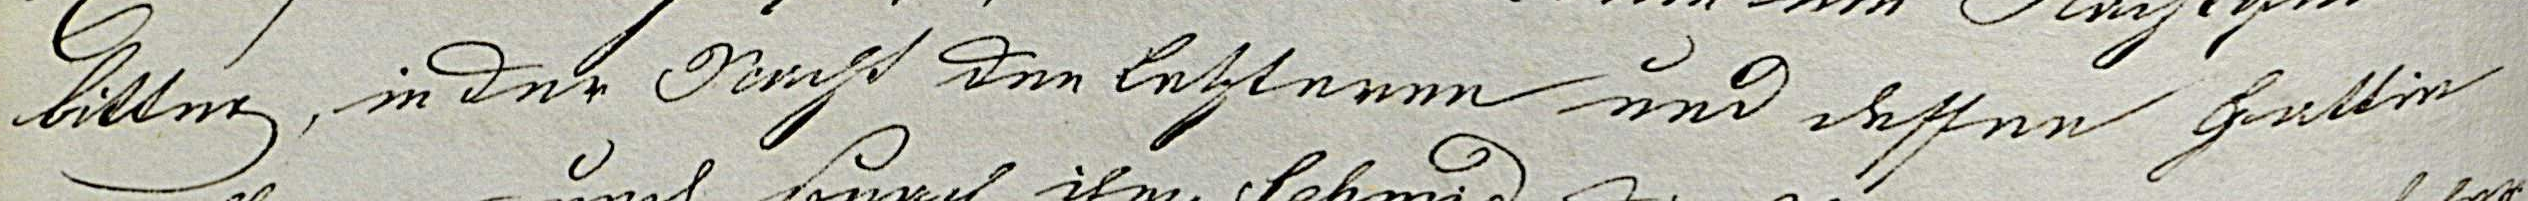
bitten, in der Nacht den letzteren und dessen Gattin
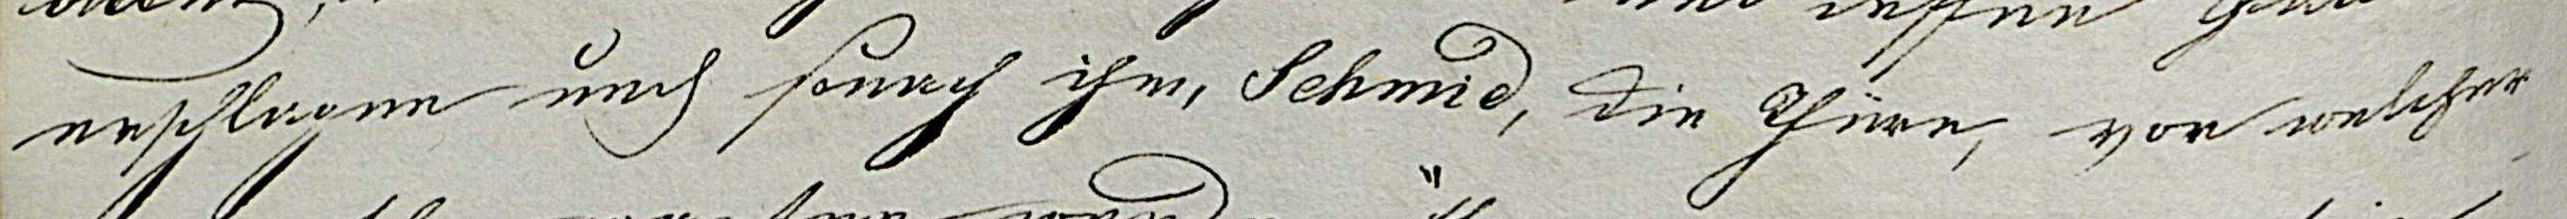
erschlagen auch sonach ihm, Schmid, die Thüre, vor welcher
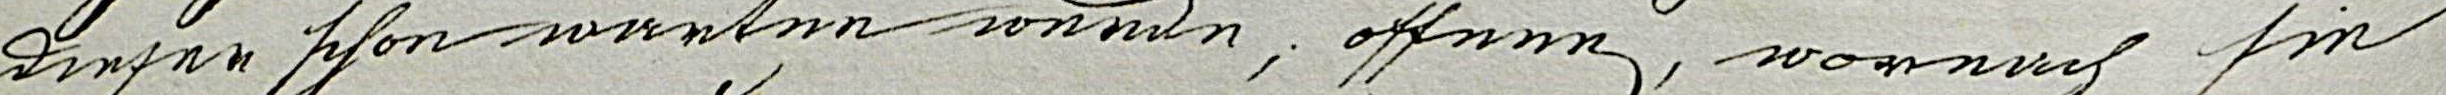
dieser schon warten werde, öffnen, wornach sie
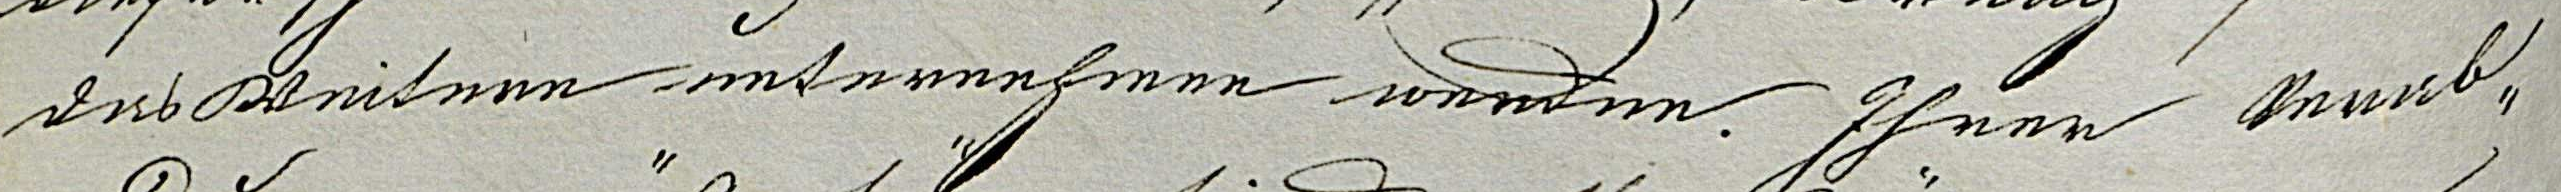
das Weitere unternehmen werden. Ihrer Verab¬
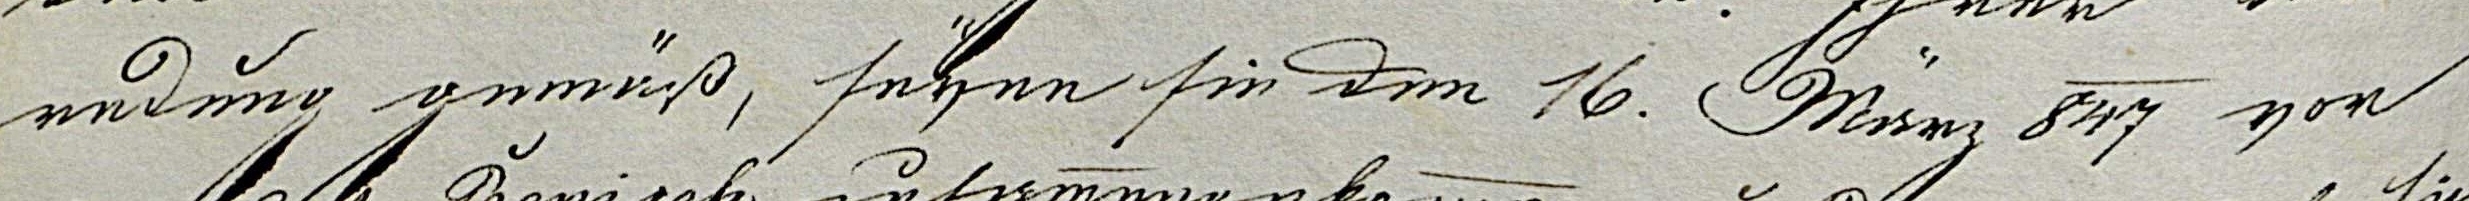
redung gemäß, seyen sie dem 16. März 1847 vor
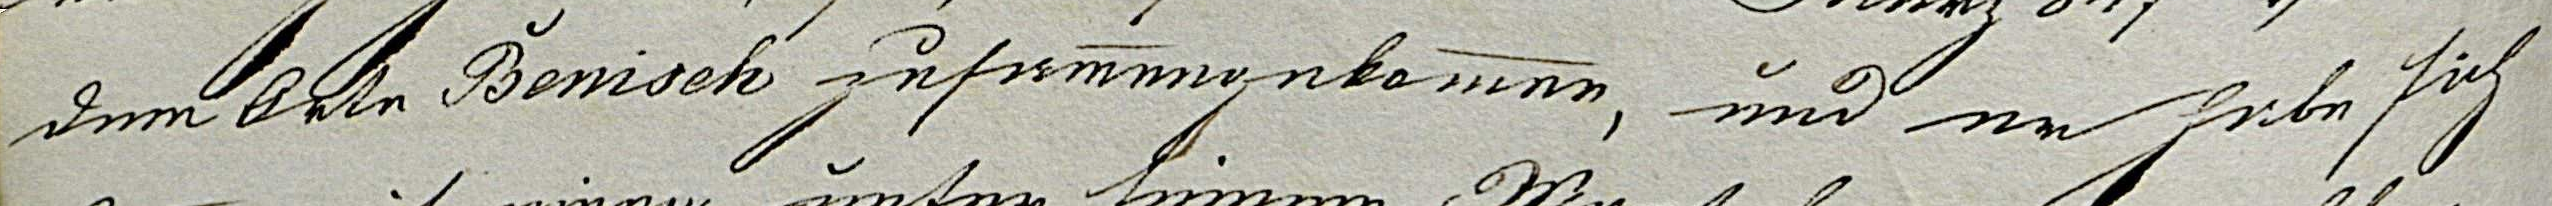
dem Orte Benisch zusammengekommen, und er habe sich
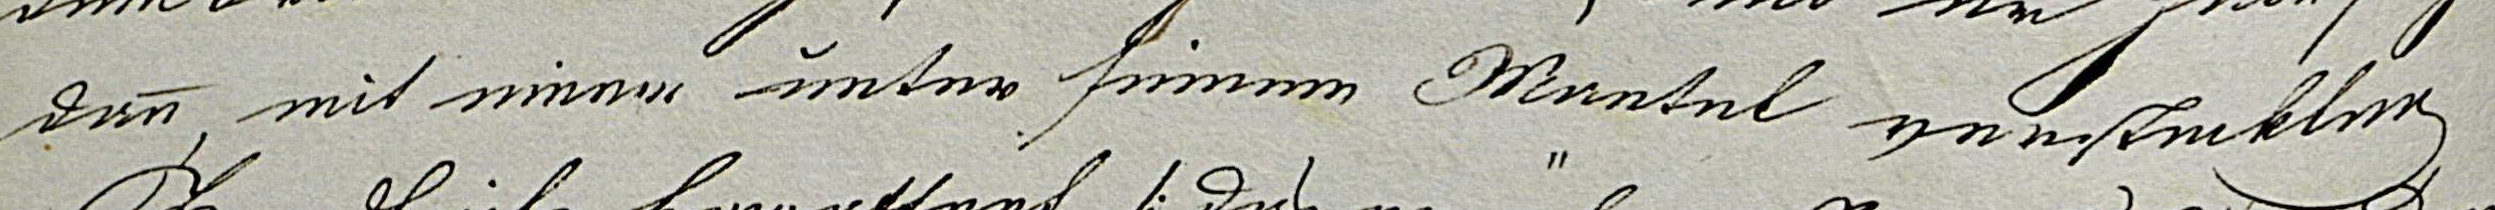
dann, mit einem unter seinem Mantel versteckter
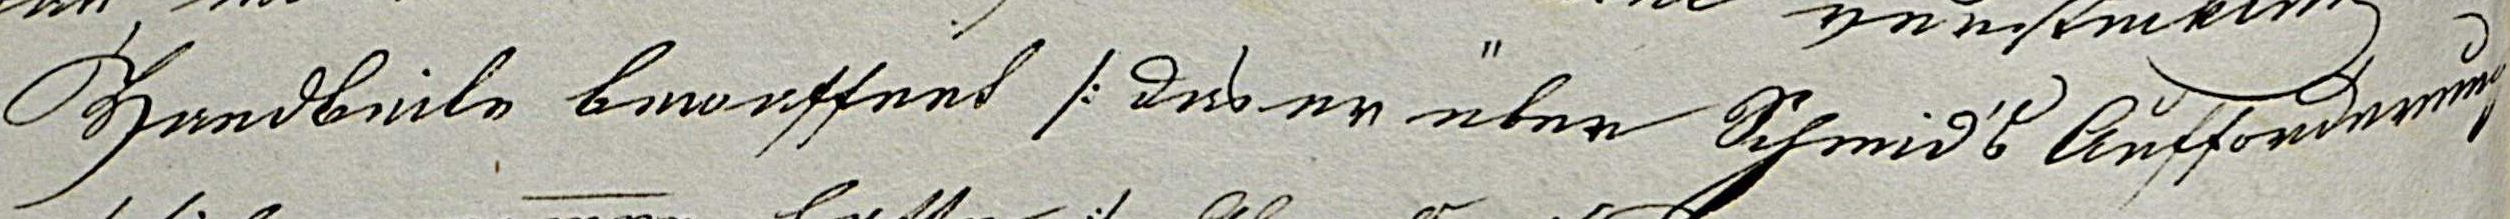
Handbeile bewaffnet (das er über Schmid’s Aufforderung
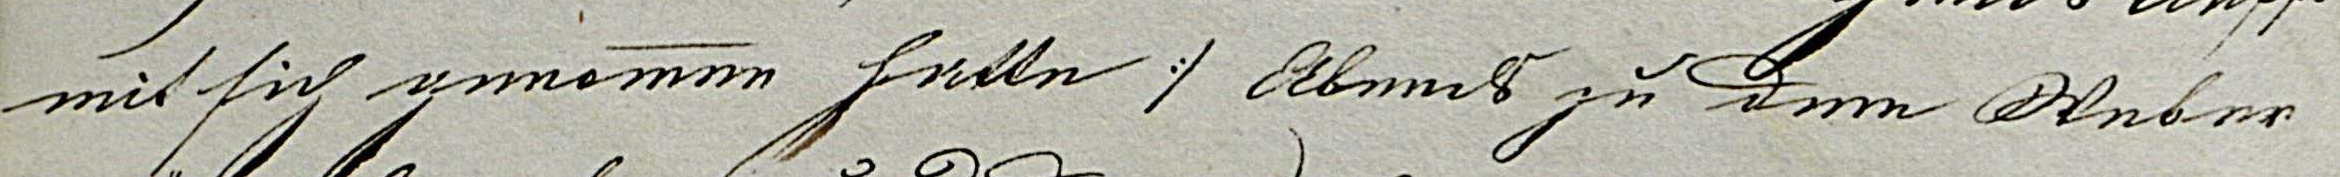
mit sich genommen hatte) Abends zu dem Weber
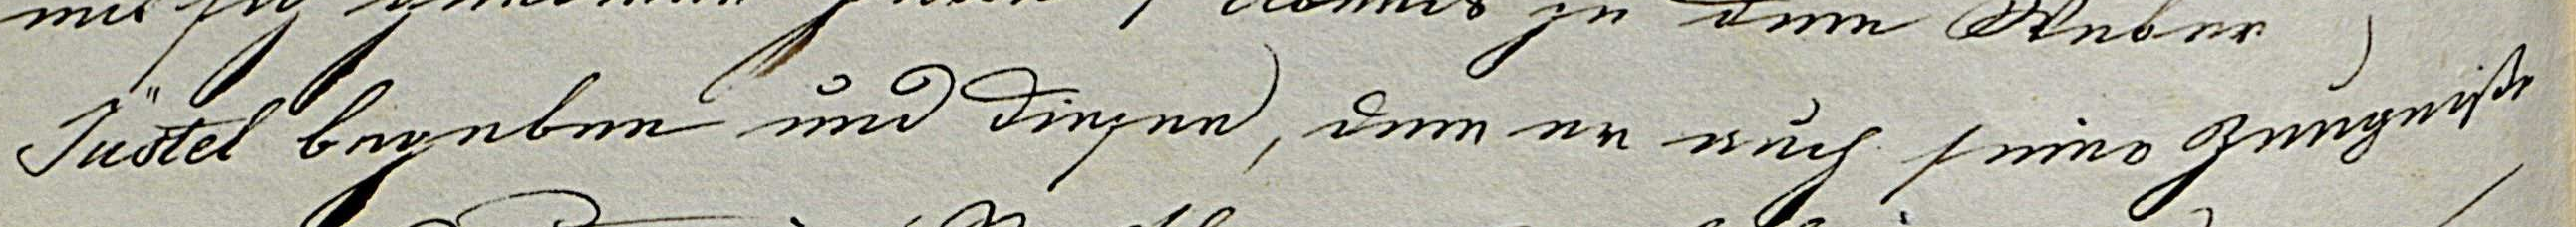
Jüstel begeben und diesen, dem er auch seine Zeugniße
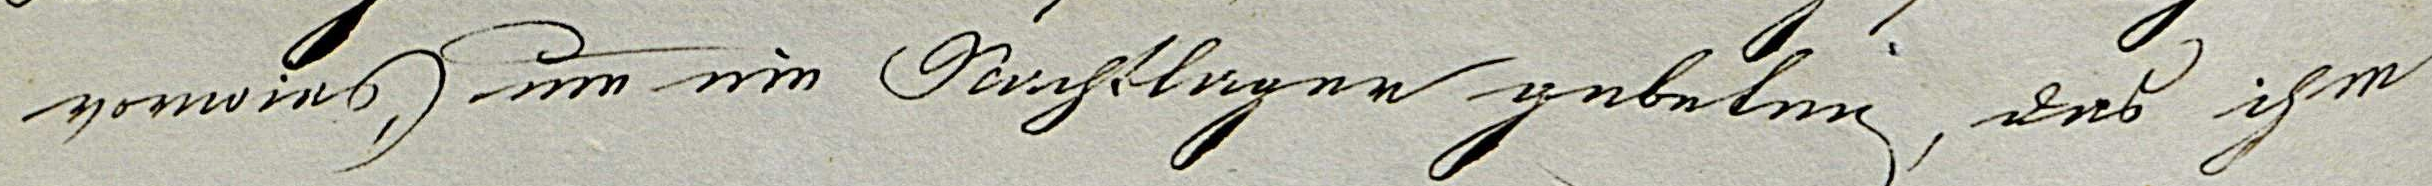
vorwies, um ein Nachtlager gebeten, das ihm
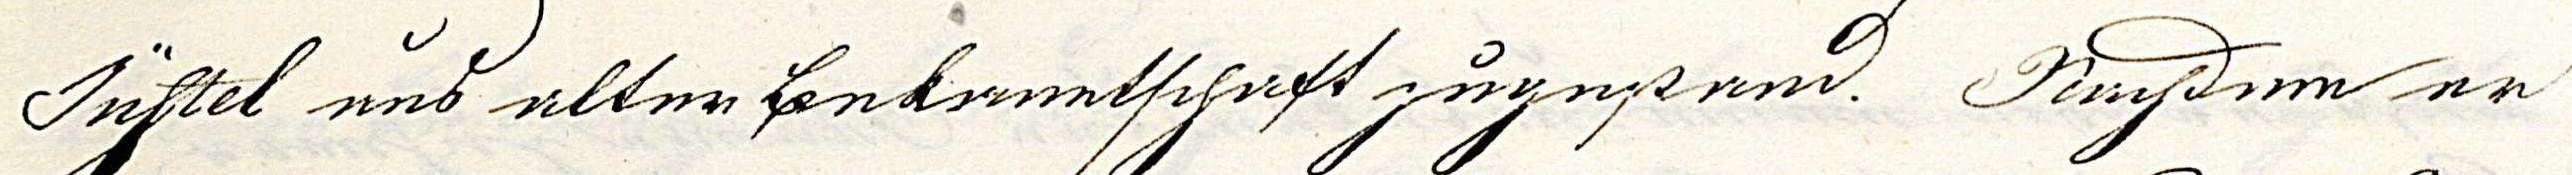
Jüstel aus alter Bekanntschaft zugestand. Nachdem er
